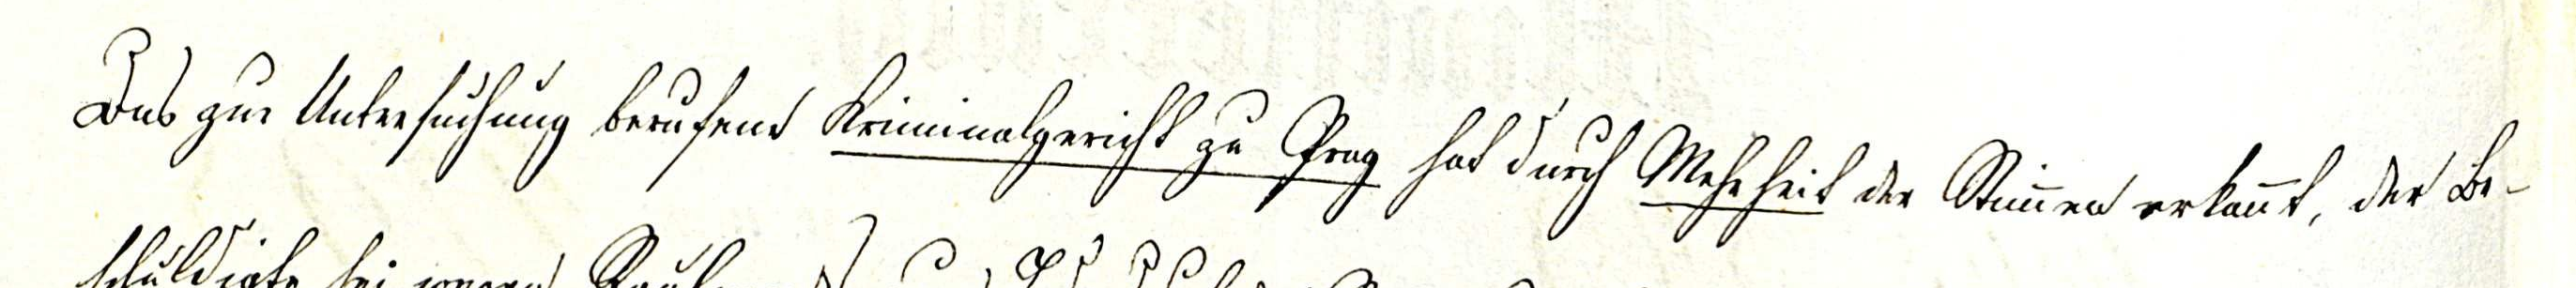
Das zur Untersuchung berufend Kriminalgericht zu Prag hat durch Mehrheit der Stimmen erkaut, der Be¬
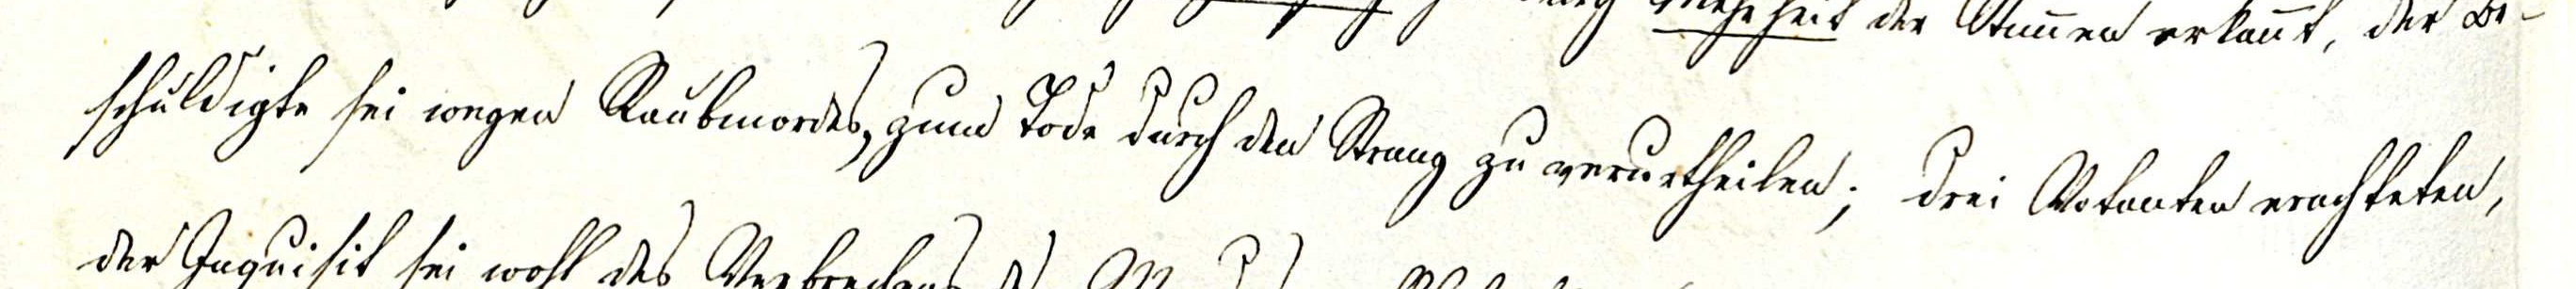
schuldigte sei wegen Raubmordes, zum Tode durch den Strang zu verurtheilen; drei Rotanten erachteten,
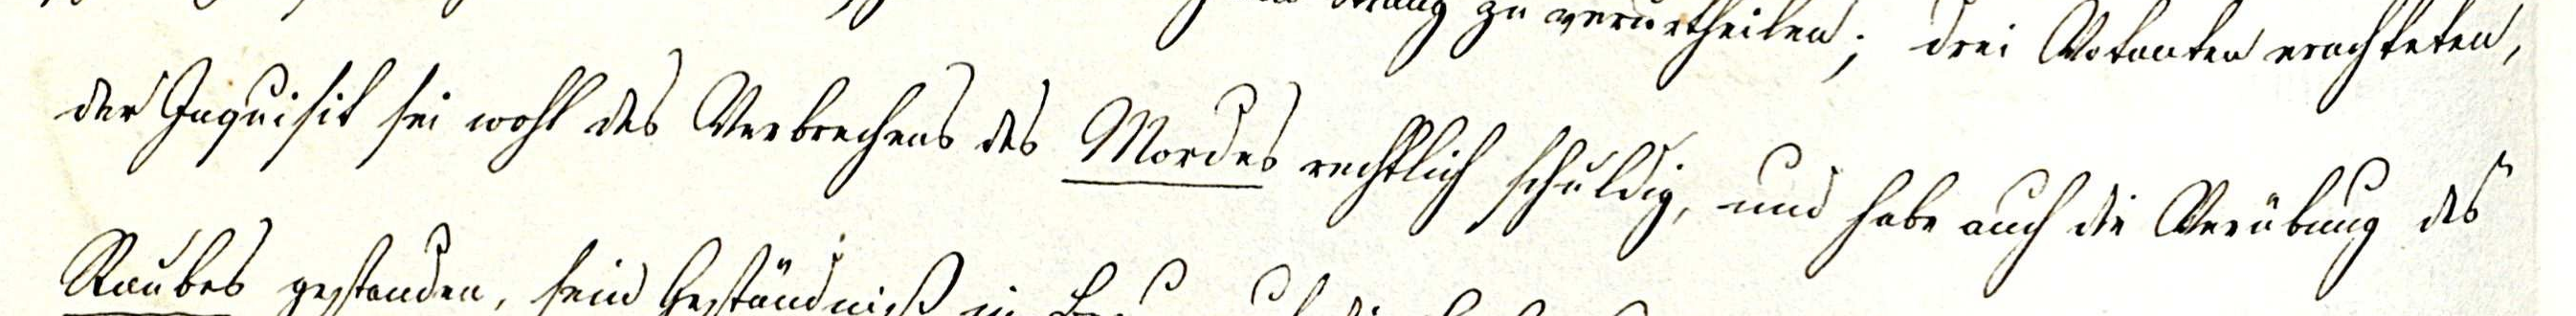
der Jnquisit sei wohl des Verbrechens des Mordes rechtlich schuldig, und habe auch die Verübung des
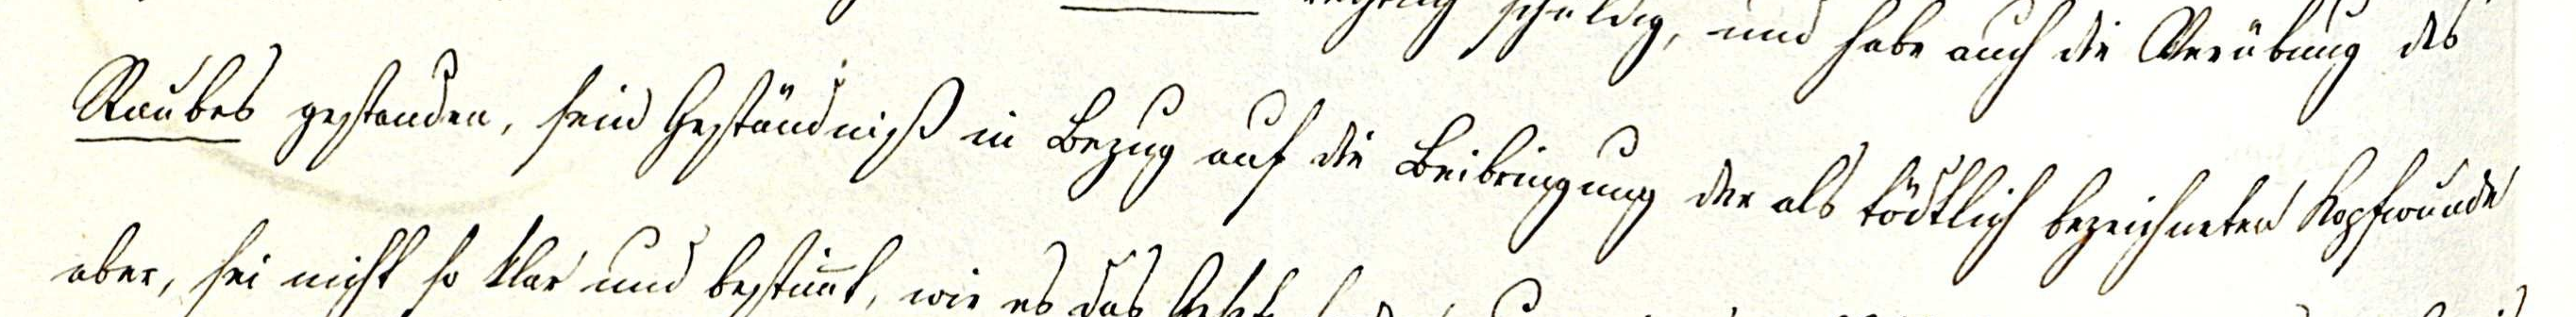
Raubes gestanden, sein Geständniß in Bezug auf die Beibringung der als tödlich bezeichneten Kopfwunde
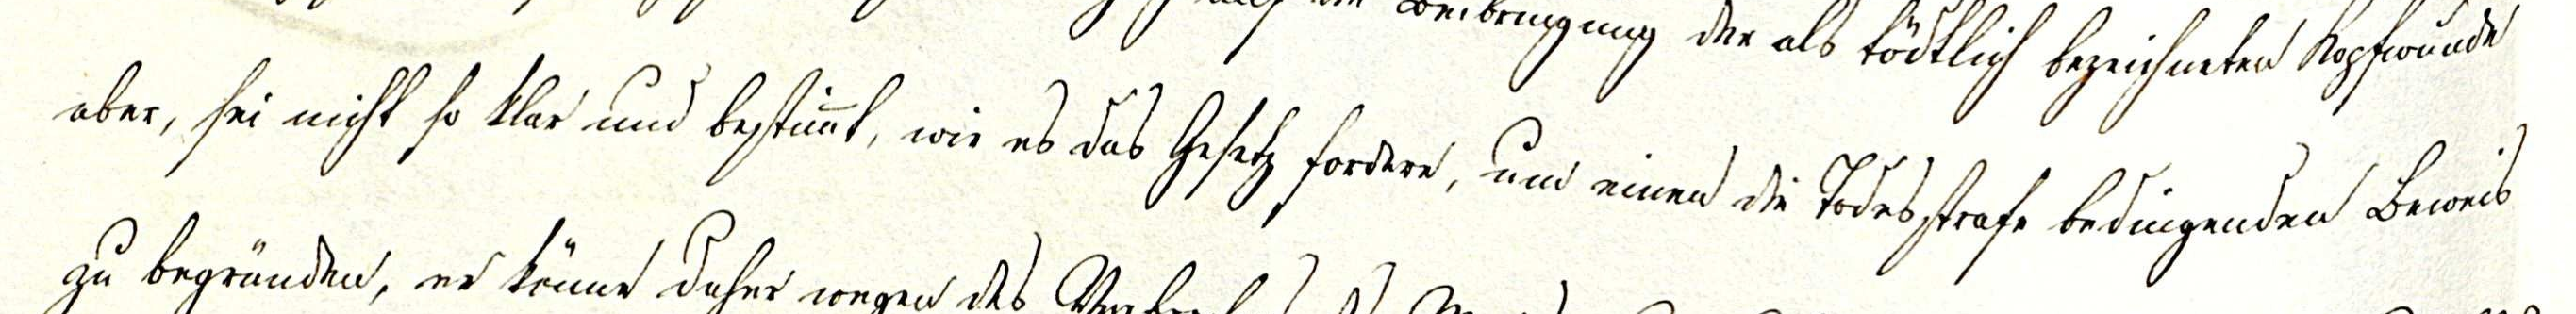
aber, sei nicht so klar und bestimmt, wie es das Gesetz fordere, um einen die Todesstrafe bedingenden Beweis
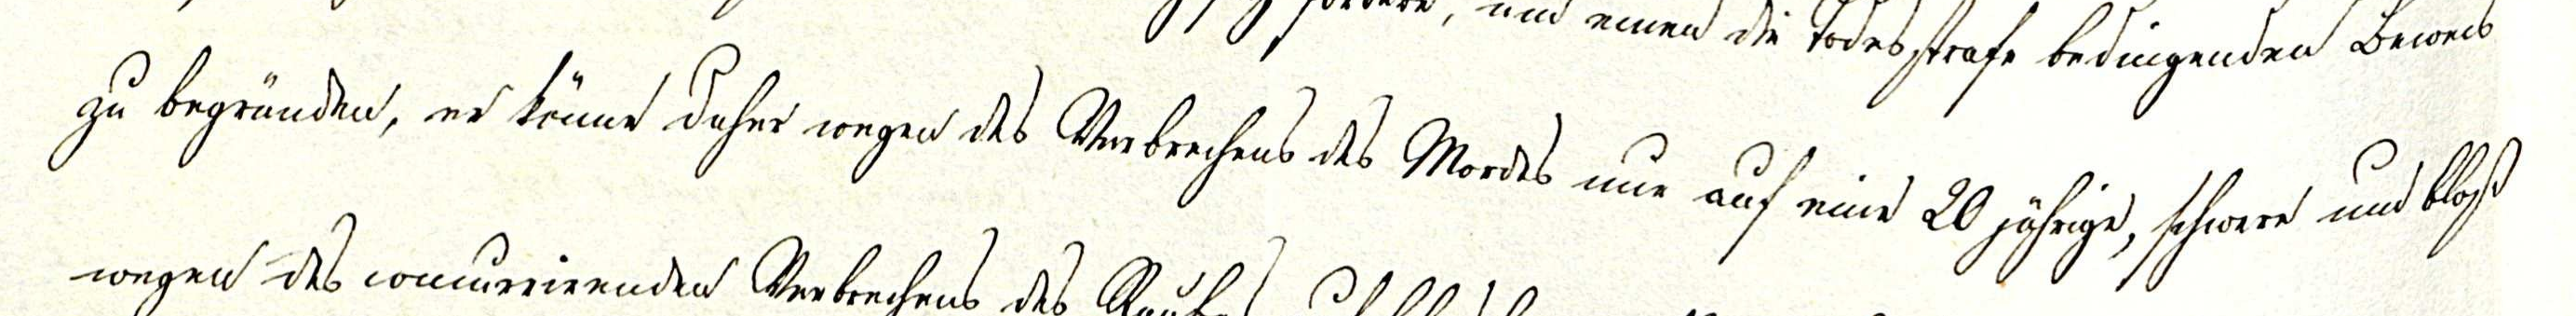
zu begründen, er könne daher wegen des Verbrechens des Mordes nur auf eine 20 jährige, schwere und bloß
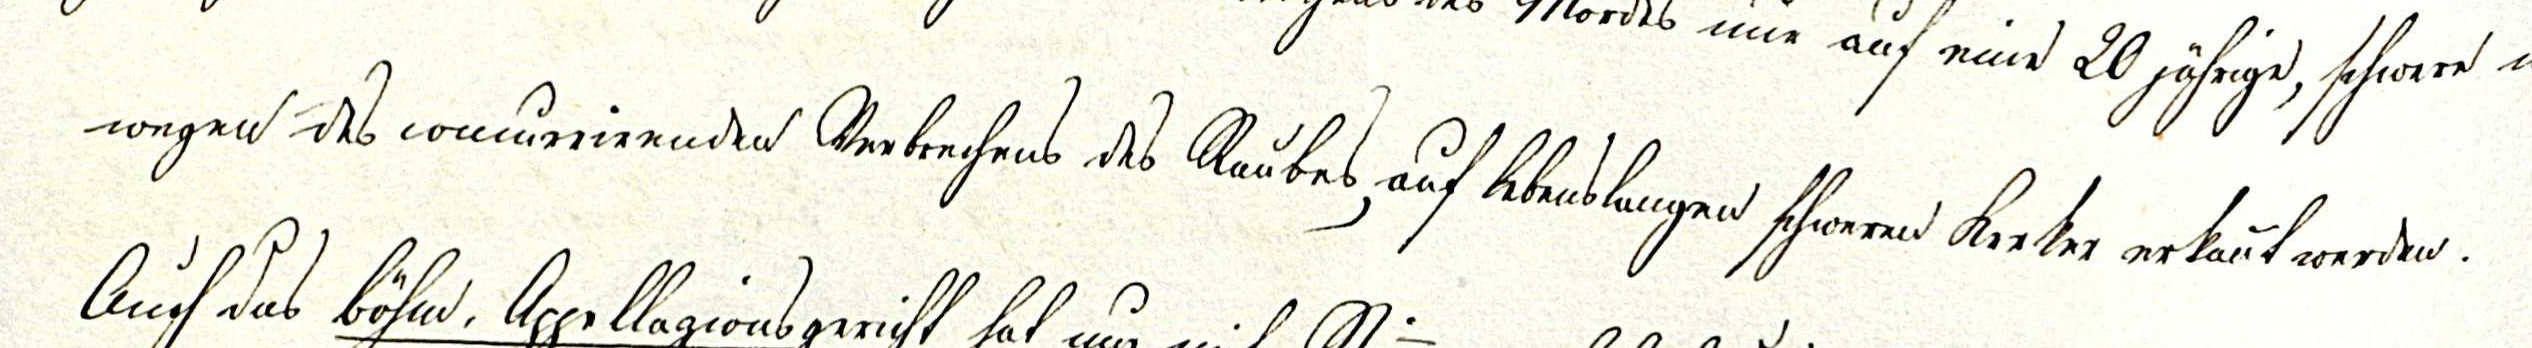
wegen des conkurrirenden Verbrechens des Raubes, auf lebenslangen schweren Kerker erkaut werden.
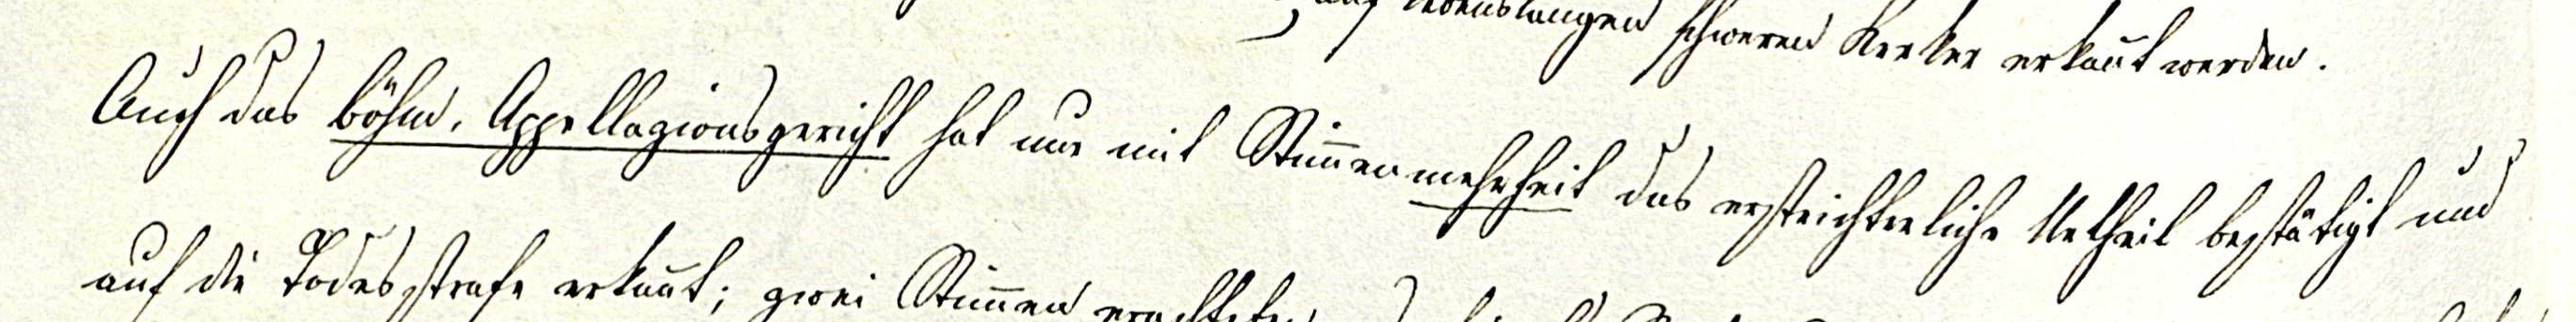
Auch das böhm. Appellazionsgericht hat nur mit Stimmenmehrheit das erstrichterliche Urtheil bestätigt und
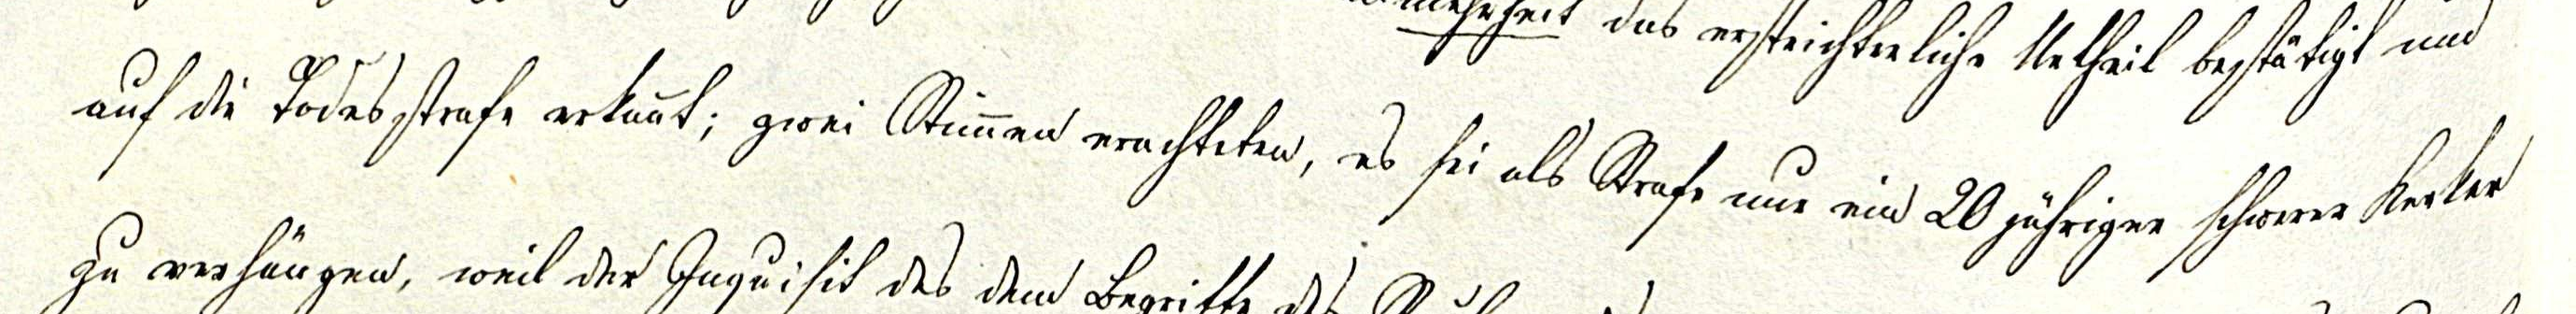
auf die Todesstrafe erkaut; zwei Stimmen erachteten, es sei als Strafe nur ein 20 jähriger schwerer Kerker
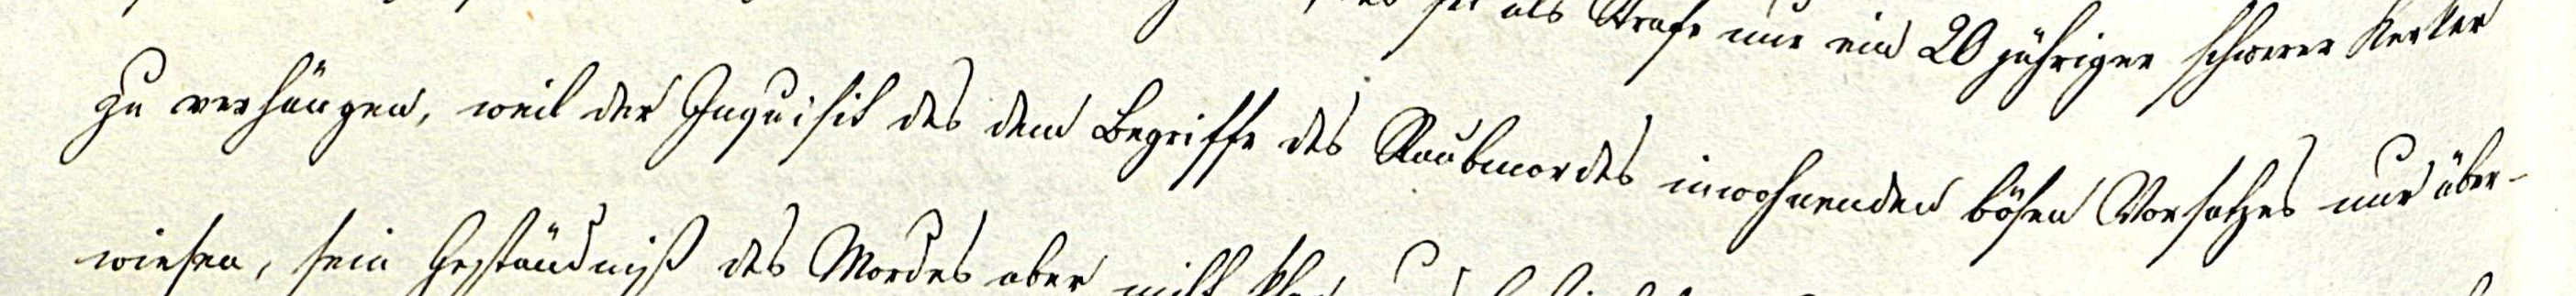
zu verhängen, weil der Jnquisit des dem Begriffe des Raubmordes inwohnenden bösen Vorsatzes nur über¬
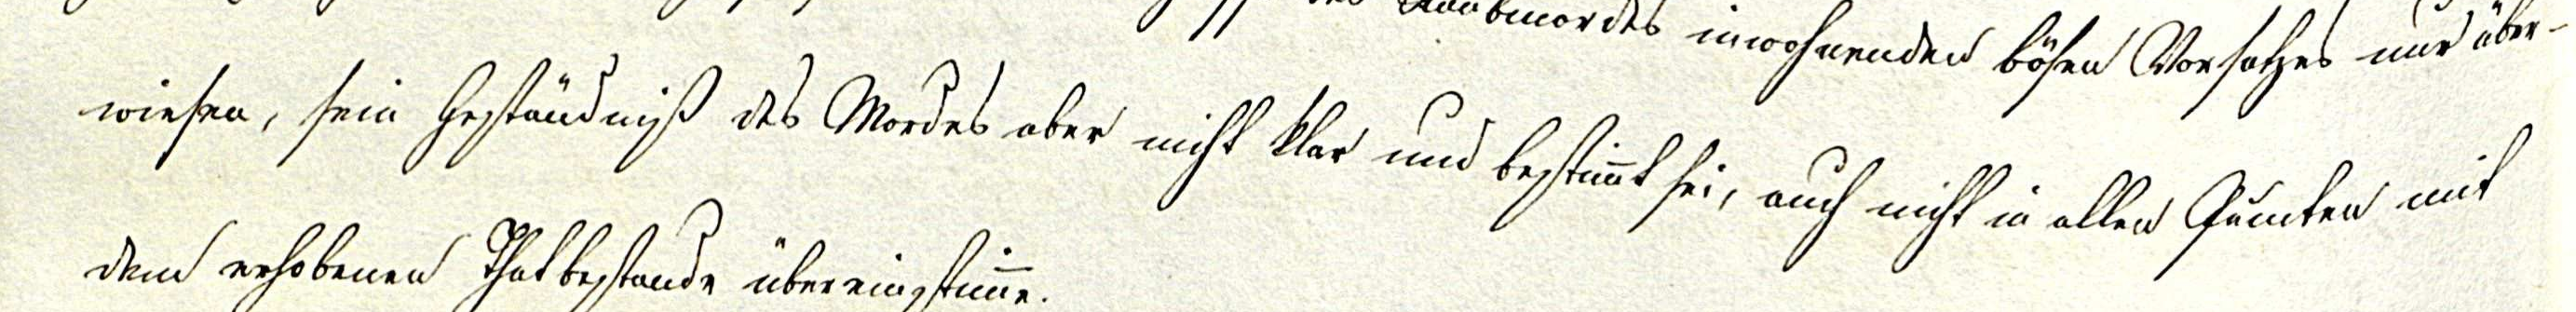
wiesen, sein Geständniß des Mordes aber nicht klar und bestimmt sei, auch nicht in allen Puncten mit
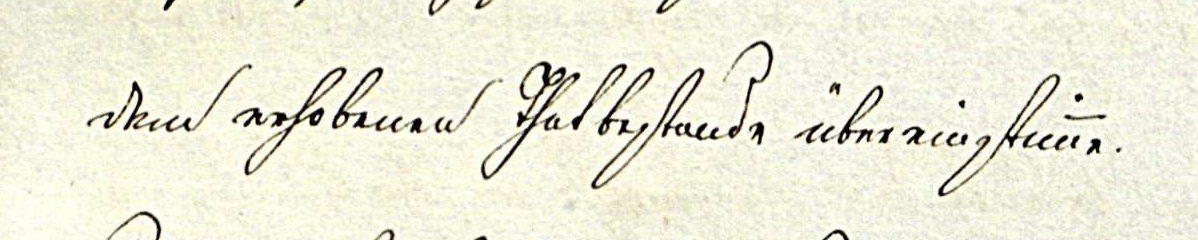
dem erhobenen Thatbestande übereinstimme.
